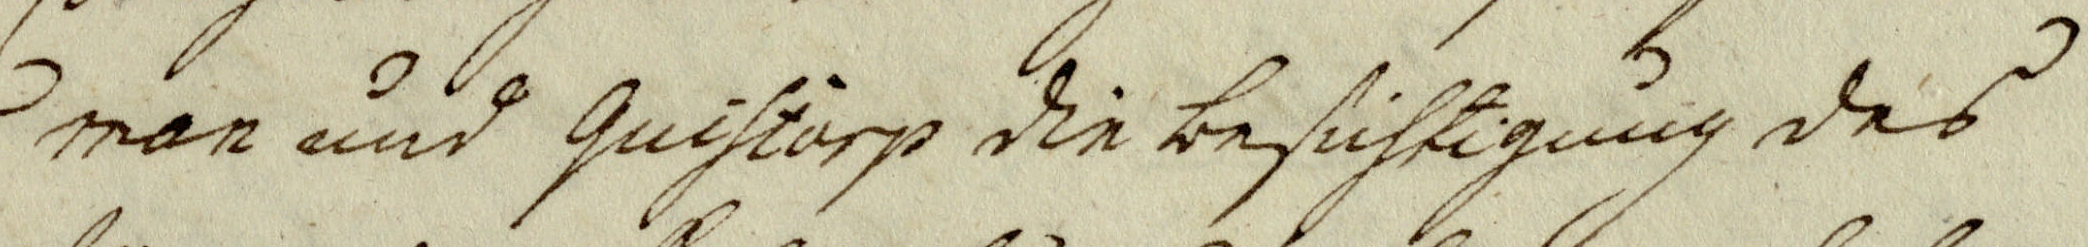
man und Quistorp die Besichtigung des
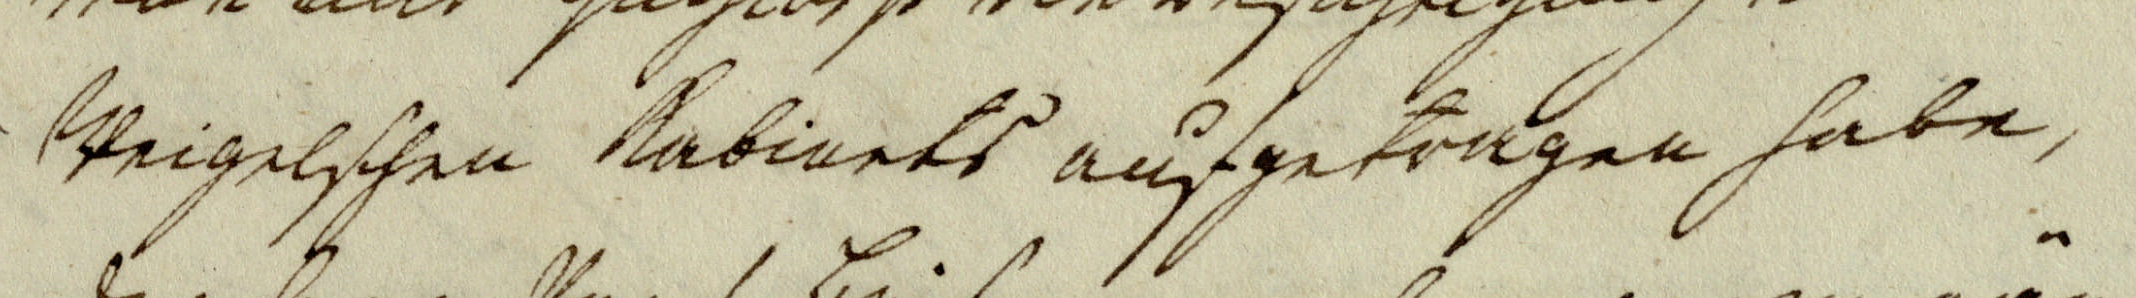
Weigelschen Kabinets aufgetragen habe,
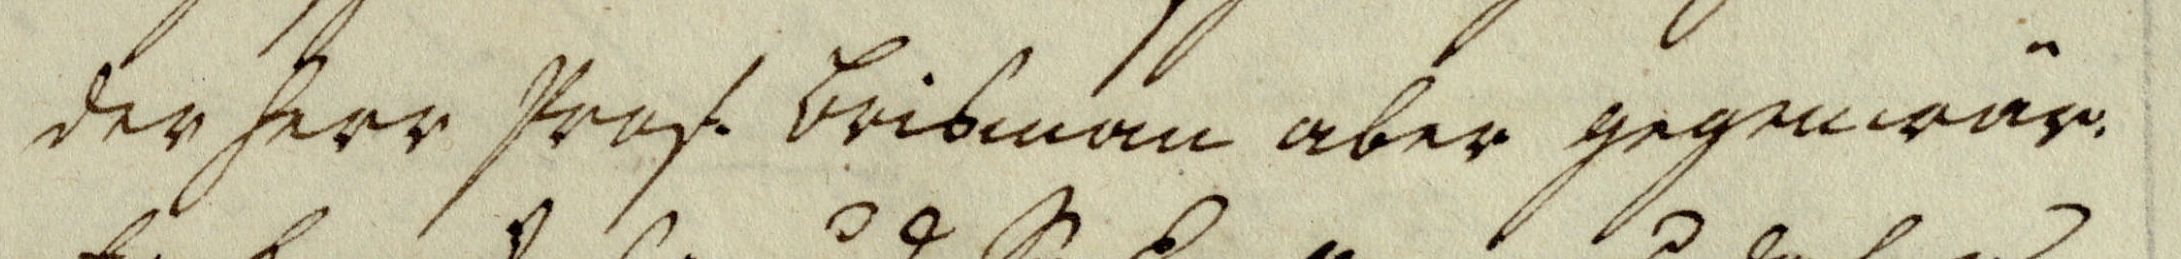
der Herr Prof. Brisman aber gegenwär¬
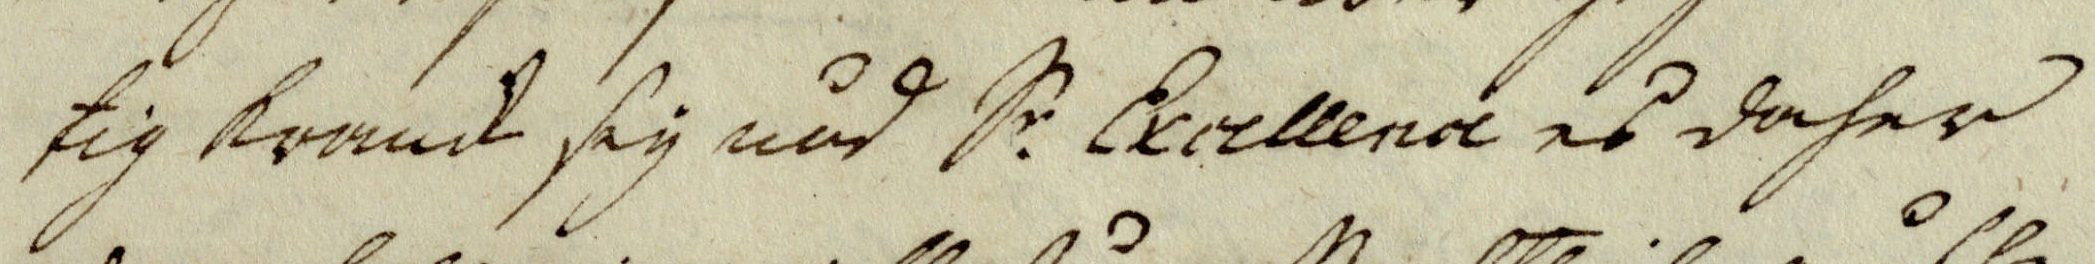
tig kanck seÿ und Sr. Excellence es daher
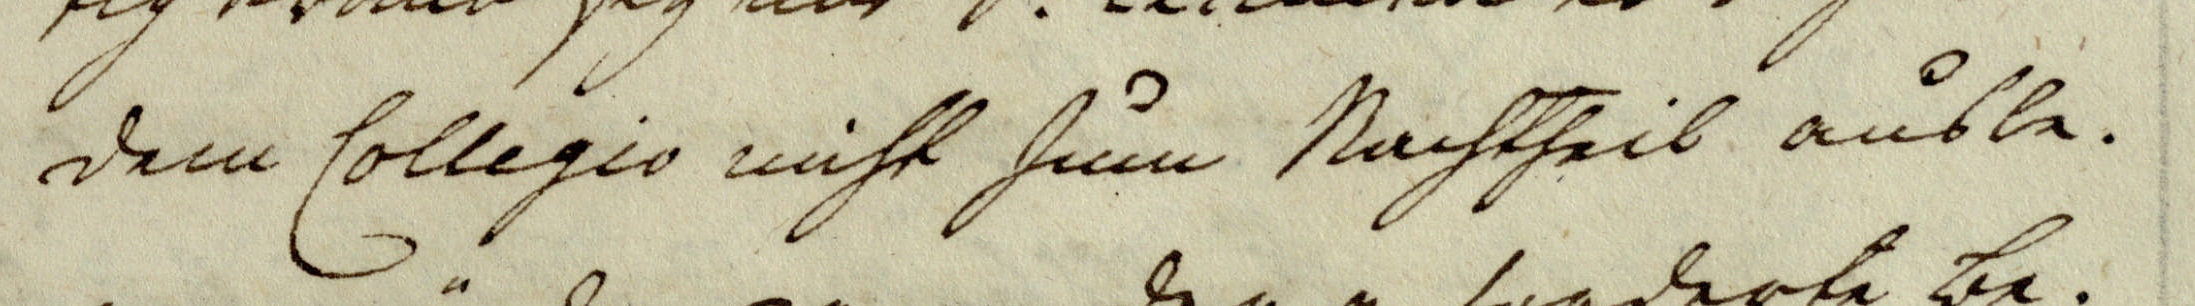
dem Collegio nicht zum Nachtheil ausle¬
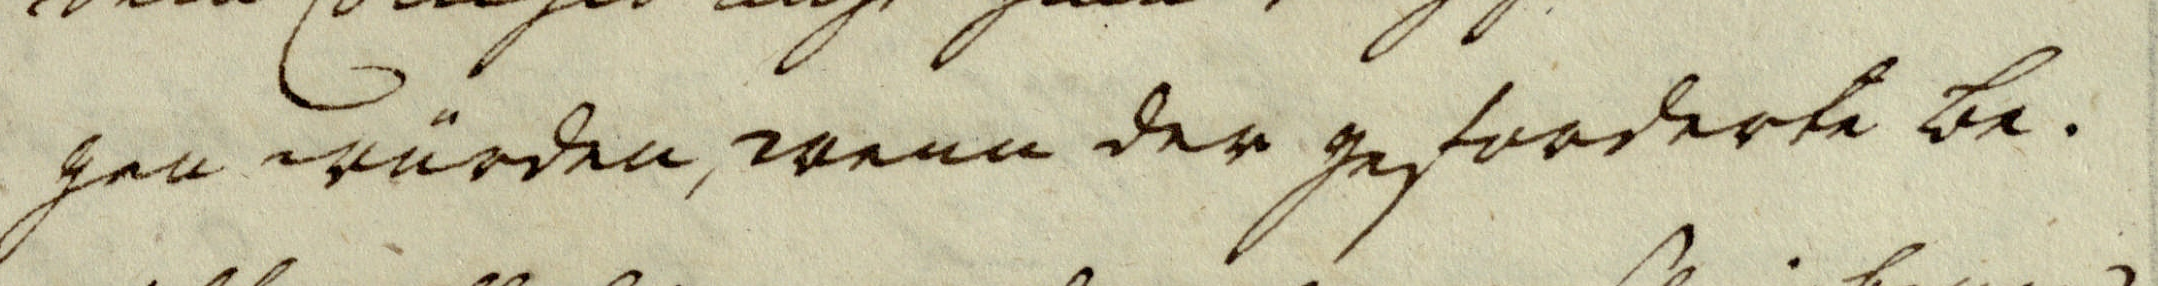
gen würden, wenn der geforderte Be¬
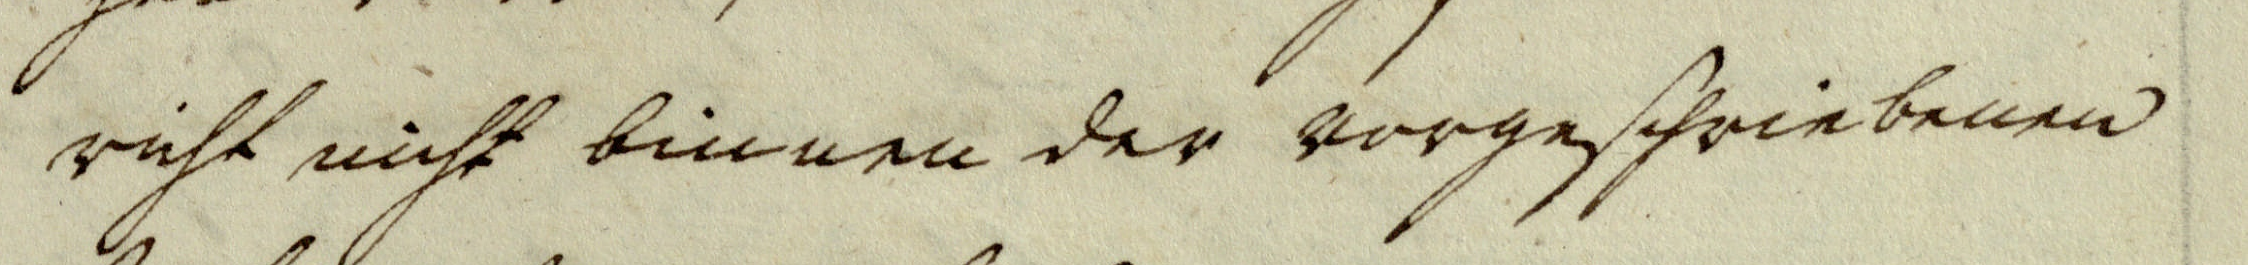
richt nicht binnen der vorgeschriebenen
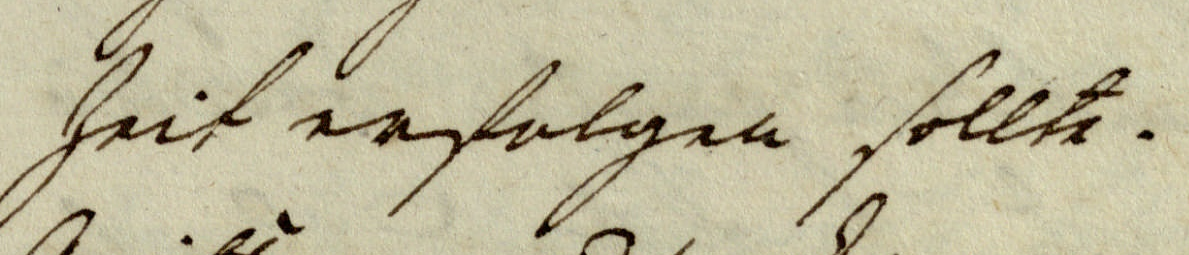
Zeit erfolgen sollte.
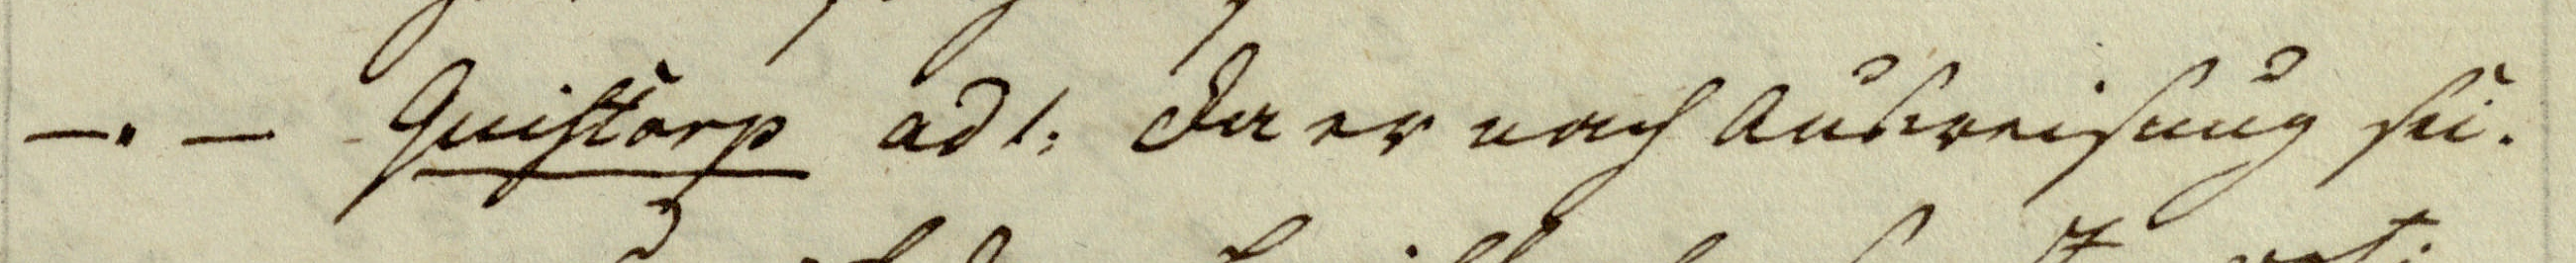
Quistorp ad 1. Da er nach Ausweisung sei¬
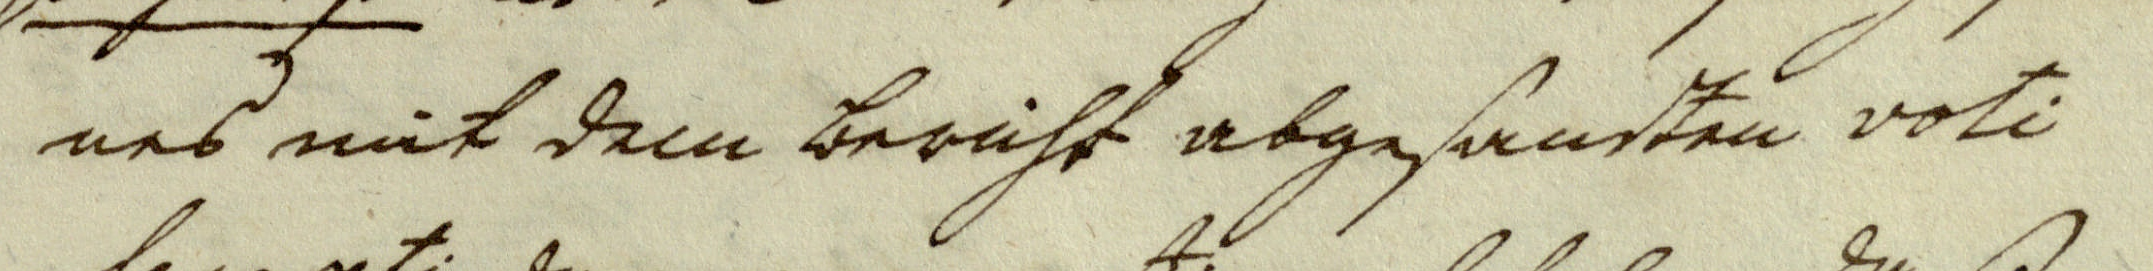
bes mit dem Bericht abgesandten voti
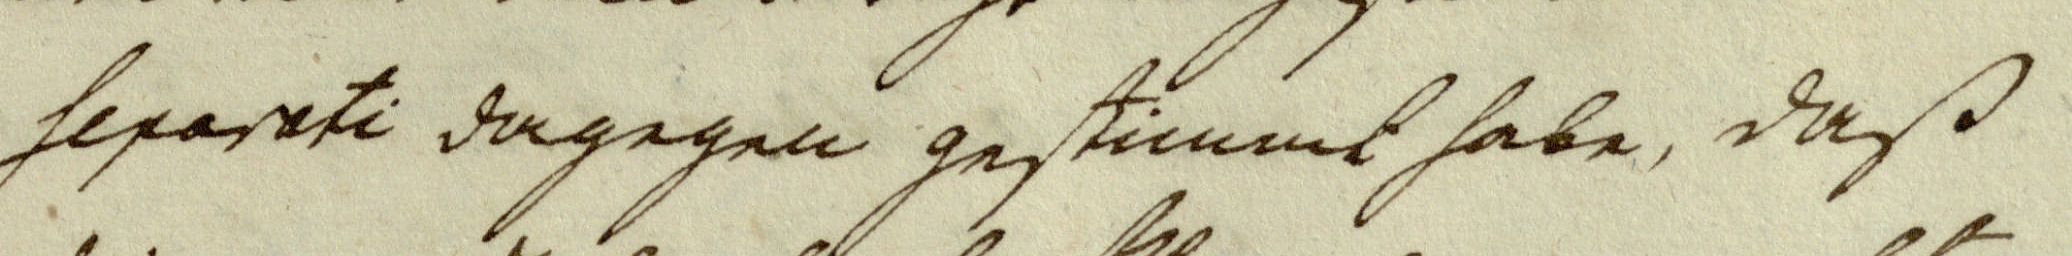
separati dagegen gestimmt habe, daß
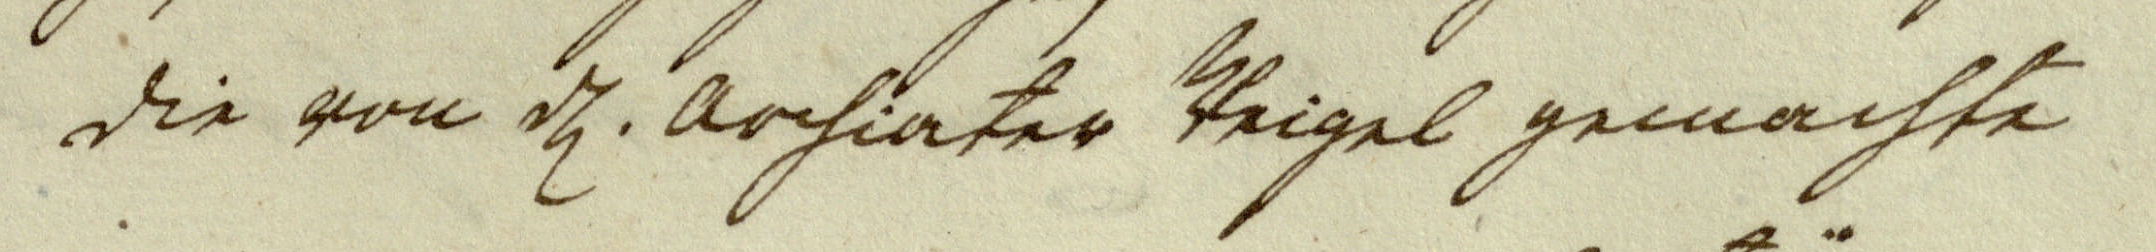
die von dh. Archiater Weigel gemachte
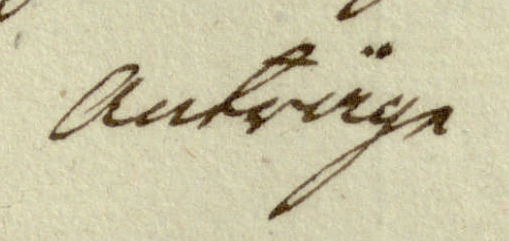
Anträge.
